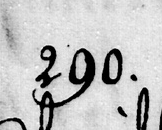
800.
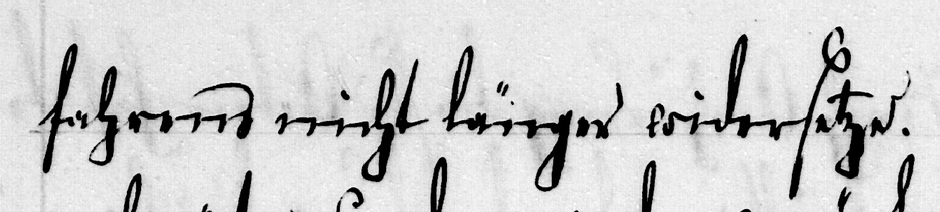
fahrens nicht länger widersetze.
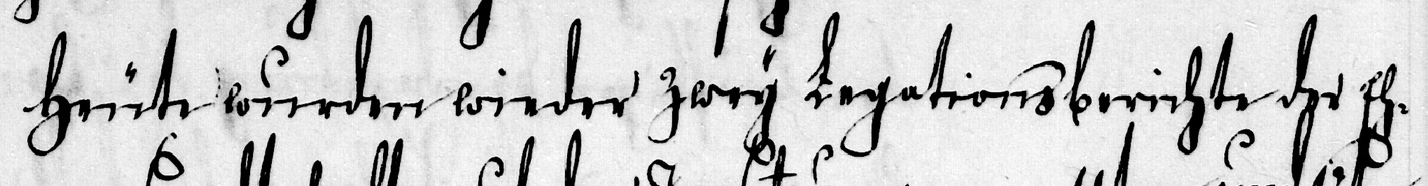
Heute wurden wieder zwey Legationsberichte der Eh¬
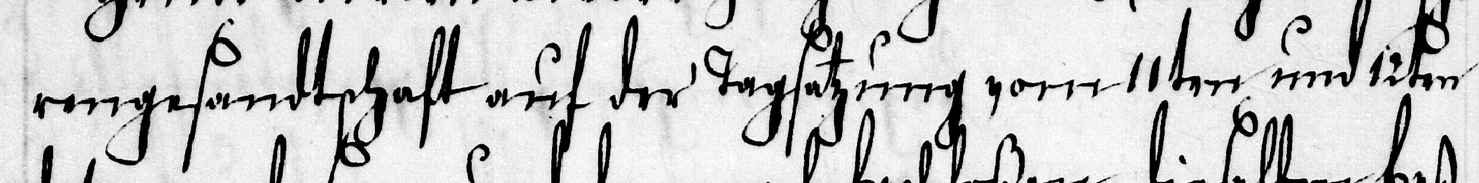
rengesandtschaft auf der Tagsatzung vom 11ten und 12ten
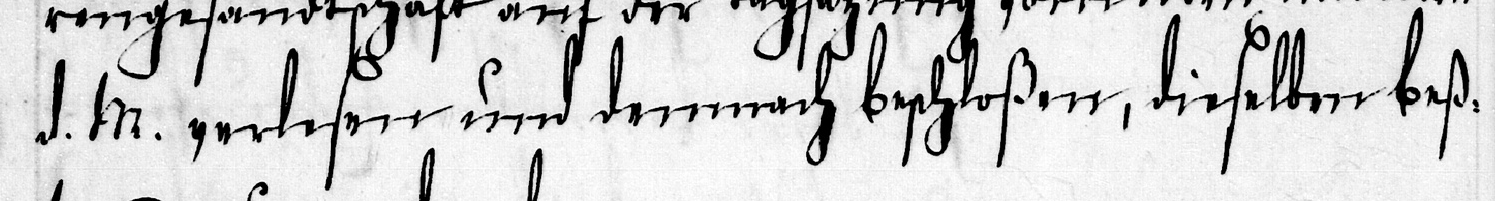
d. M. verlesen und demnach beschloßen, dieselben beß¬
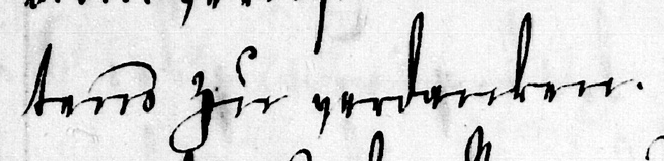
tens zu verdanken.
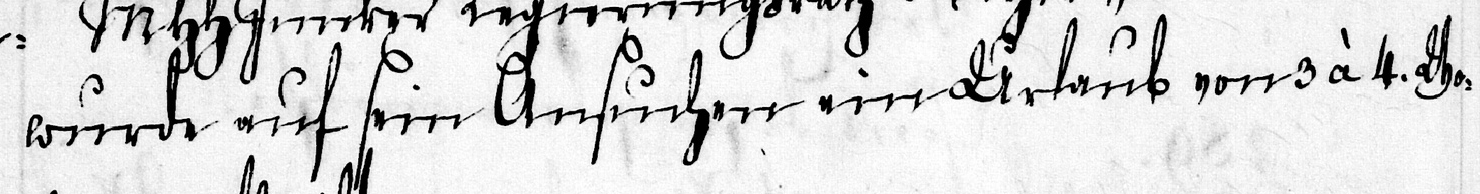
wurde auf sein Ansuchen ein Urlaub von 3 à 4. Wo¬
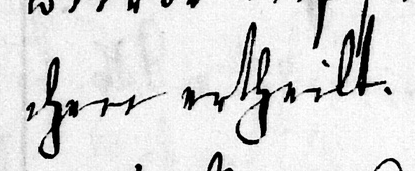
chen ertheilt.
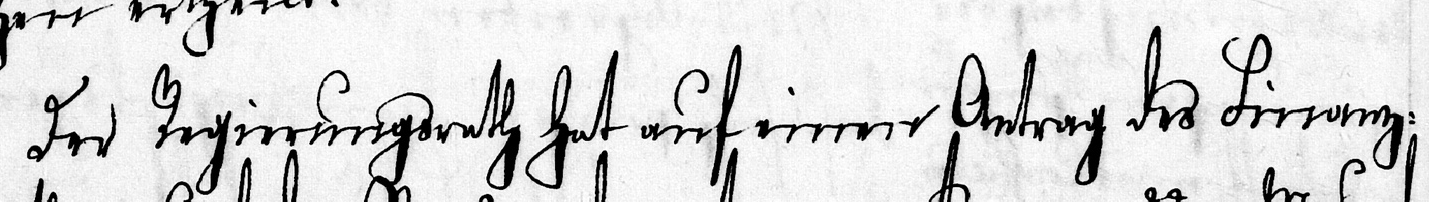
Der Regierungsrath hat auf einen Antrag des Finanz¬
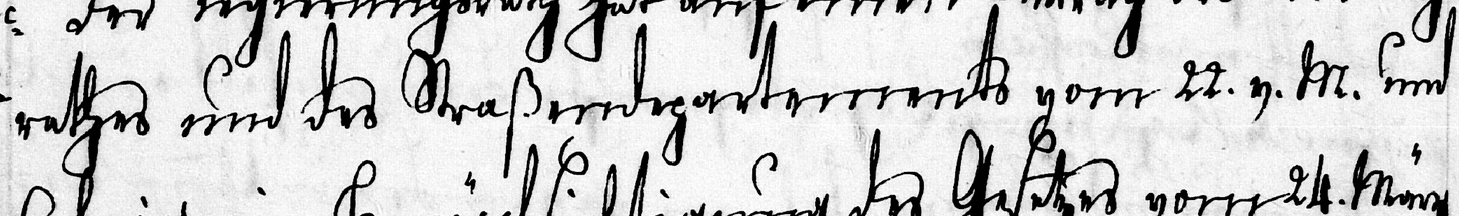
rathes und des Straßendepartements vom 22. d. M. und
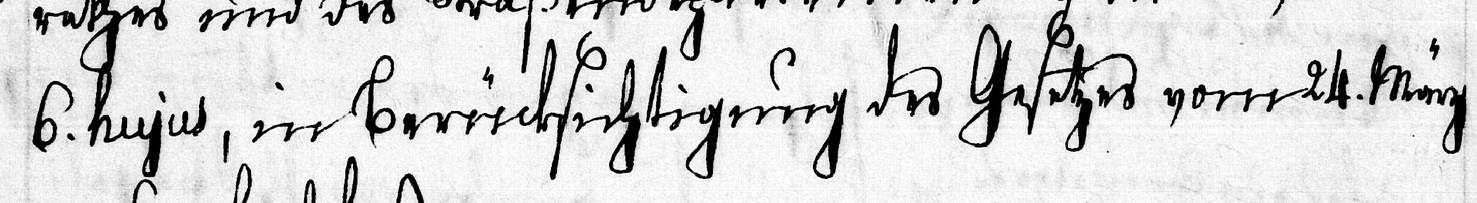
6. hujus, in Berücksichtigung des Gesetzes vom 24. März
